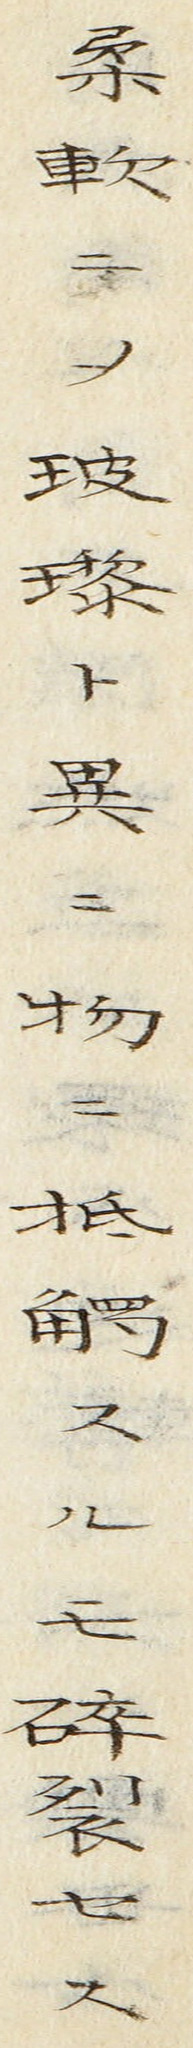柔軟ニシテ玻瓈ト異ニ物ニ抵觸スルモ碎裂セス
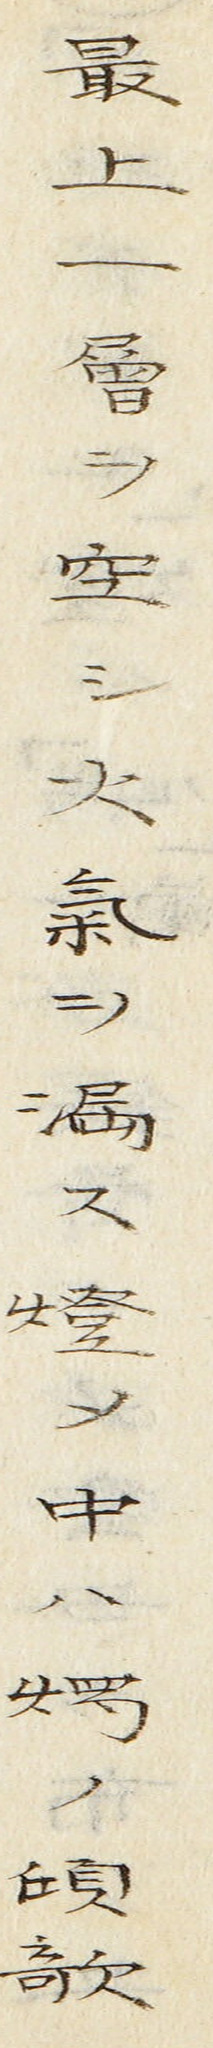最上一層ヲ空シ火気ヲ漏？ス燈シテ中ハ燭ノ欹
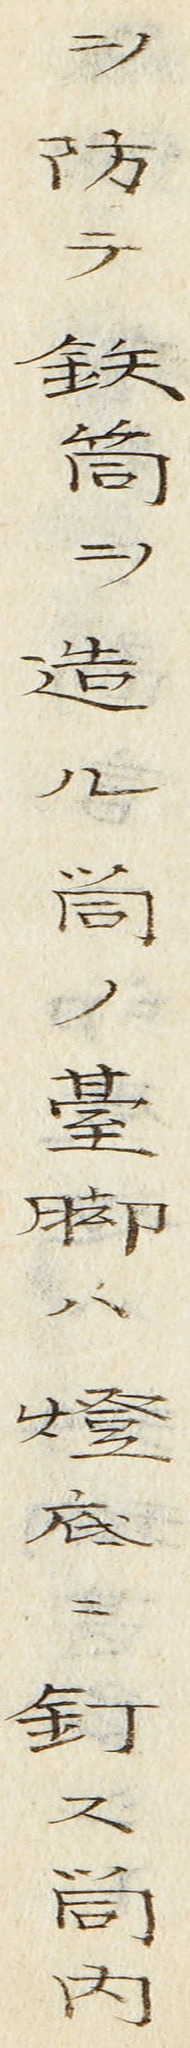ヲ防テ鉄筒ヲ造ル筒ノ䑓脚ハ燈底ニ釘ス筒内
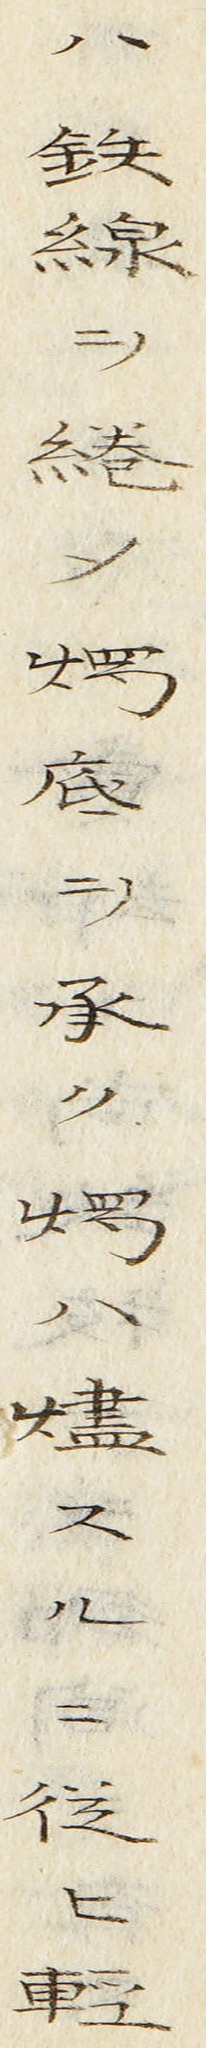ハ鉄線ヲ綣シテ燭底ヲ承ク燭ハ燼スルニ従ヒ軽
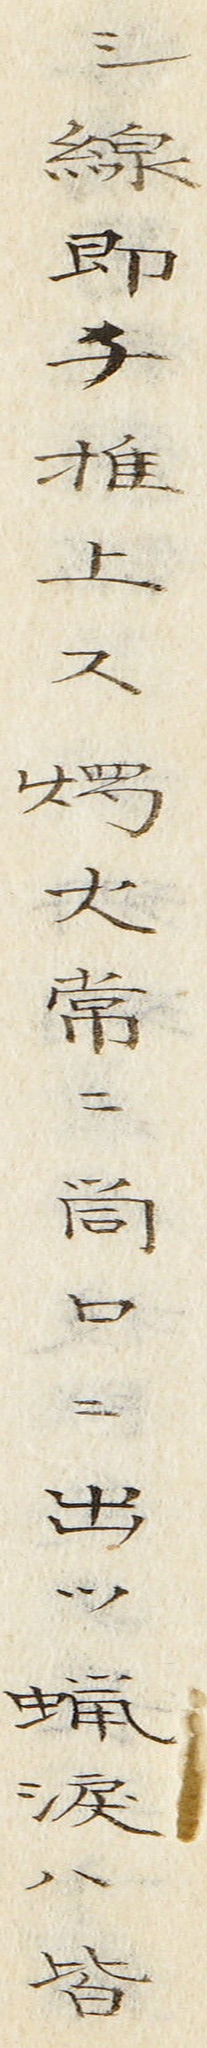シ線即チ推上ス燭火常二筒口ニ出ツ蝋涙ハ皆
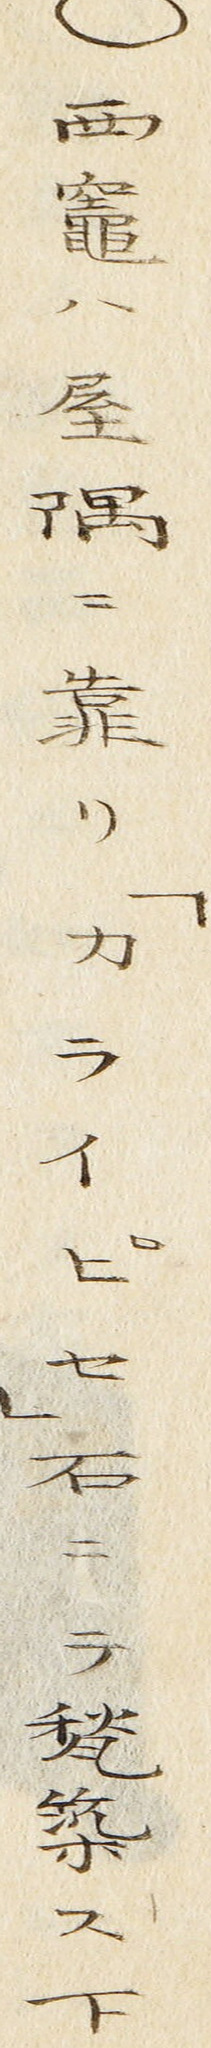〇西竈ハ屋隅ニ靠リ「カライピセ」石ニテ甃築ス下
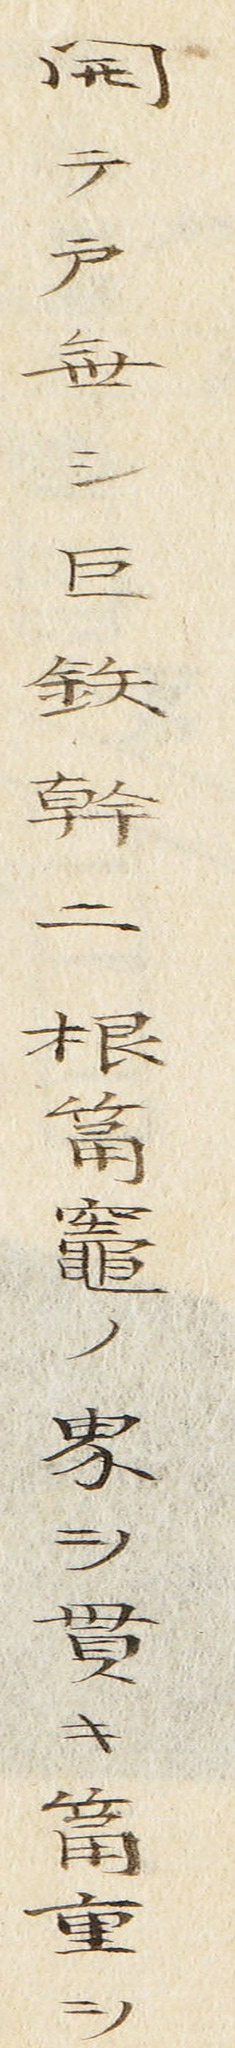開テ戸無？シ巨鉄幹ニ根筩竈ノヲ貫キ筩重ヲ
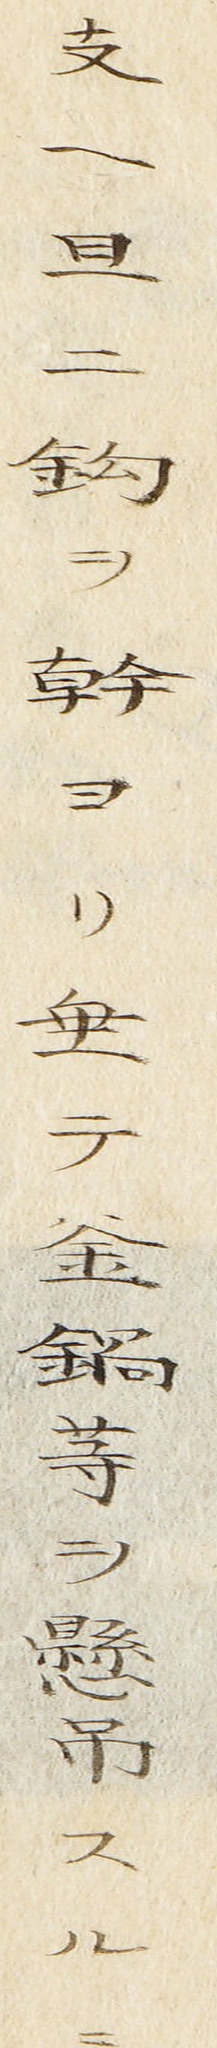支ヘ且ニ鈎ヲ幹ヨリ垂テ釜鍋等ヲ懸吊スルニ
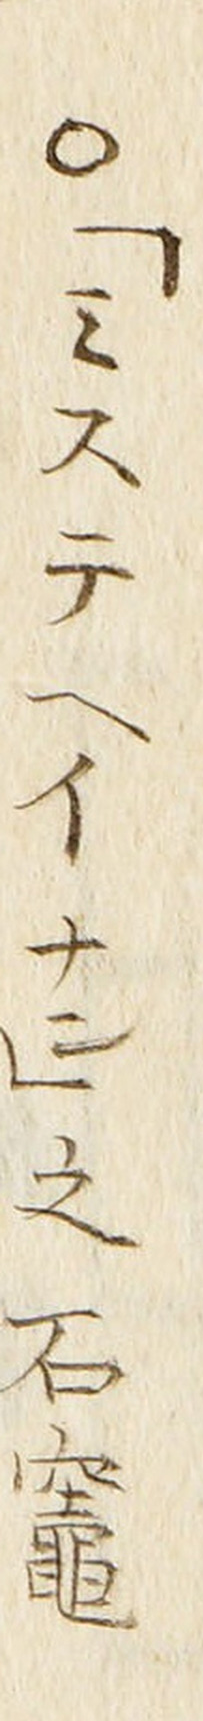〇「ミステヘイナン」之石竈

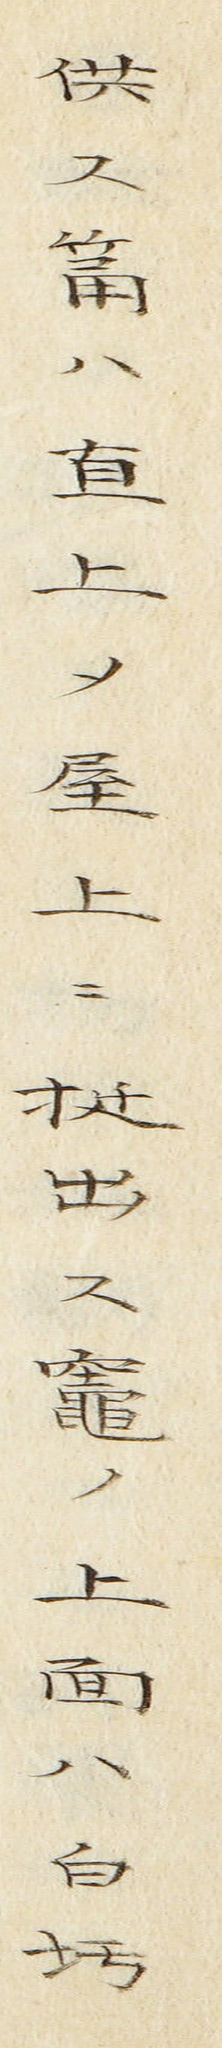供ス筩ハ直上シテ屋上二挺出ス竈ノ上面ハ白
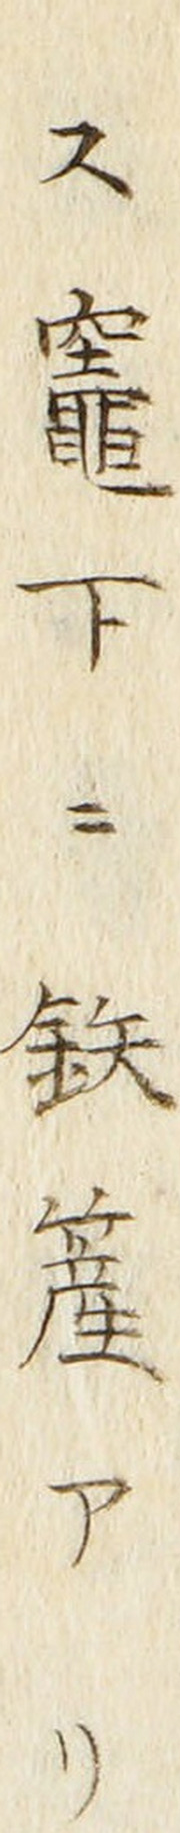ス竈下二鉄簅アリ
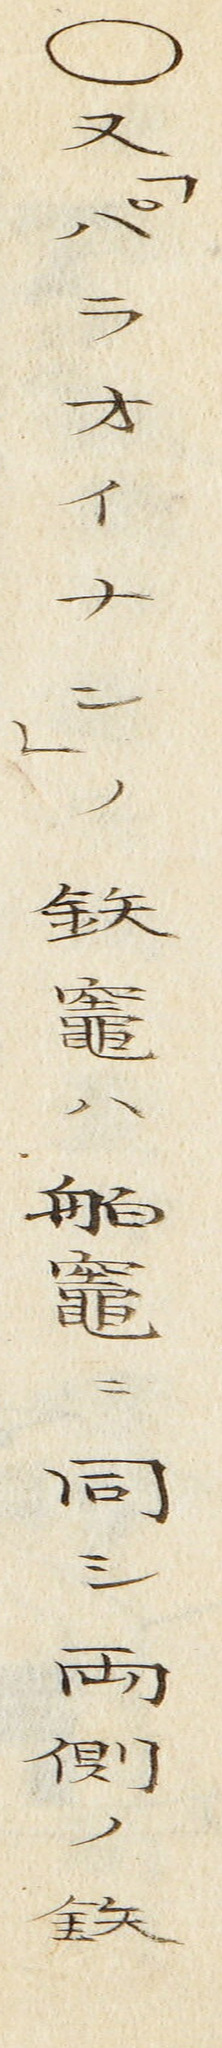〇又「パラオイナン」ノ鉄竈ハ舶竈ニ同シ両側ノ鉄
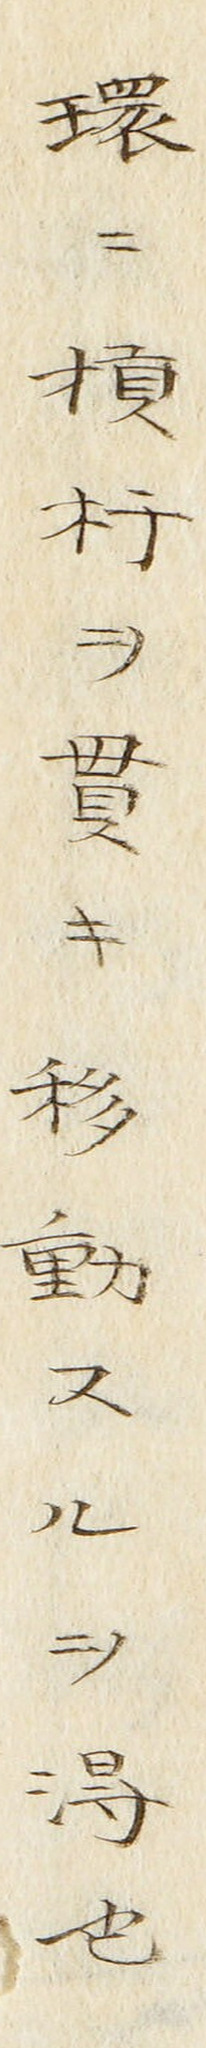環ニ槓杆ヲ貫キ移動スルヲ得也
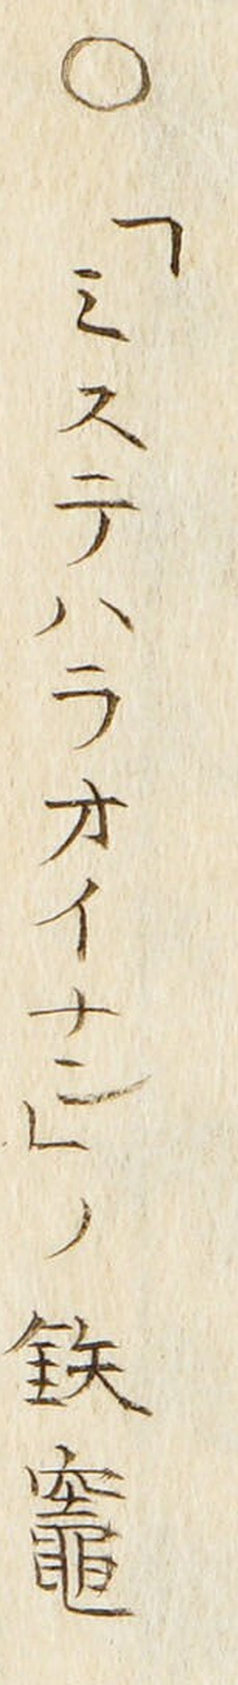〇「ミステハラオイナン」ノ鉄竈
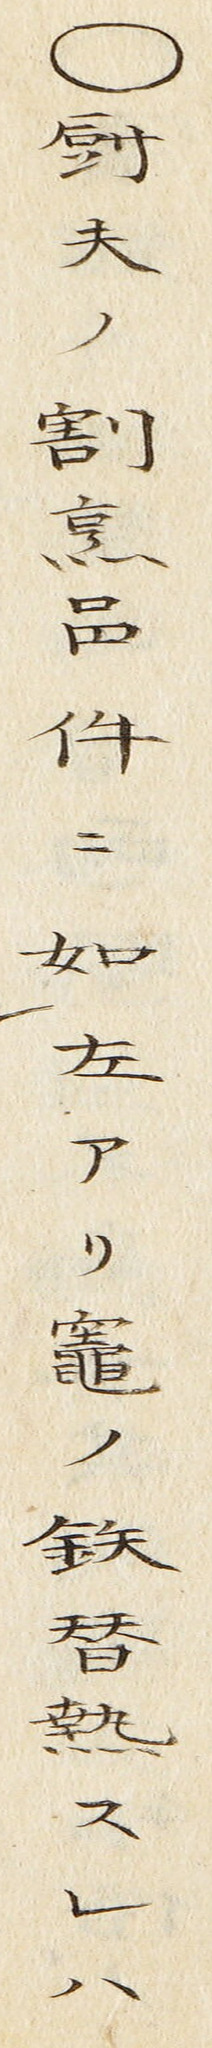〇厨夫ノ割烹品件ニ如左アリ竈ノ鉄替熱スレハ
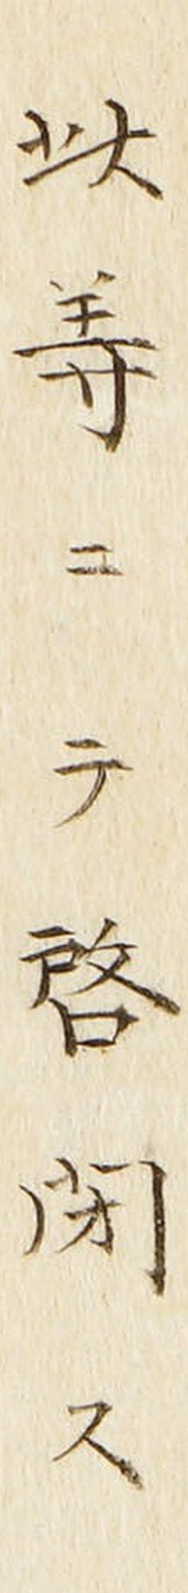此等ニテ啓閉ス
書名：蕃談
